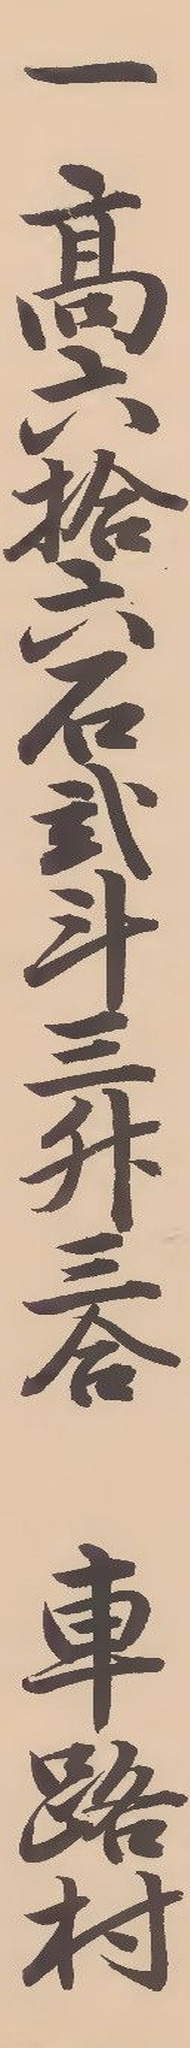一高六拾六石弐斗三升三合車路村

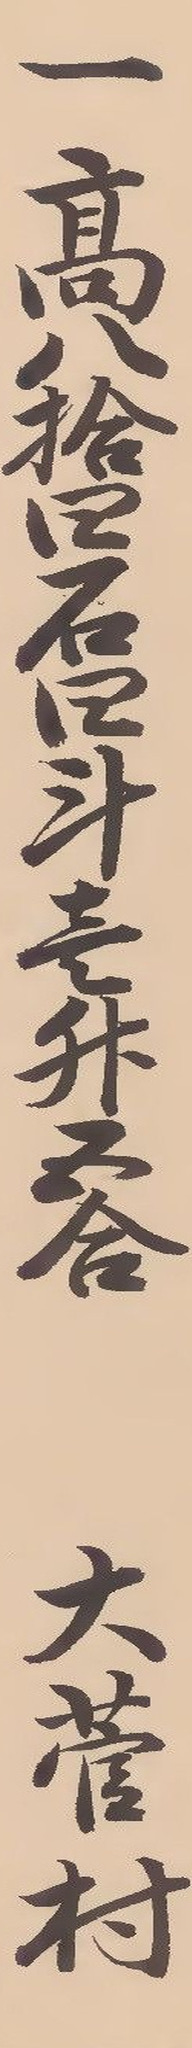一高八拾四石四斗壱升五合大菅村
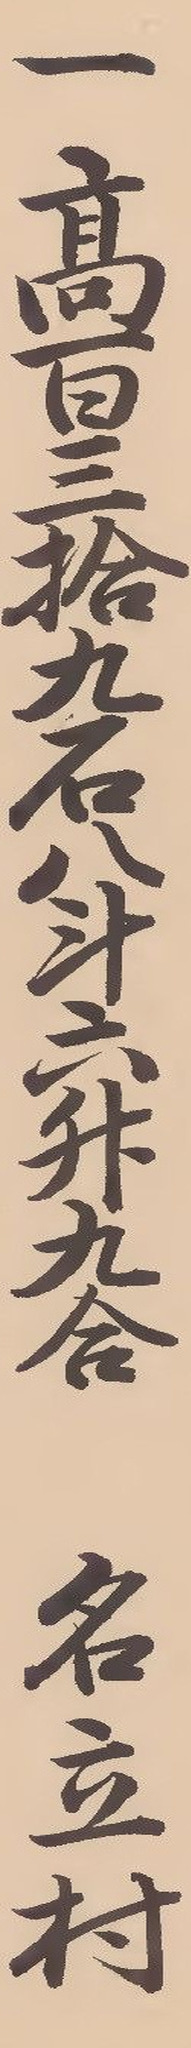一高百三拾九石八斗六升九合名立村
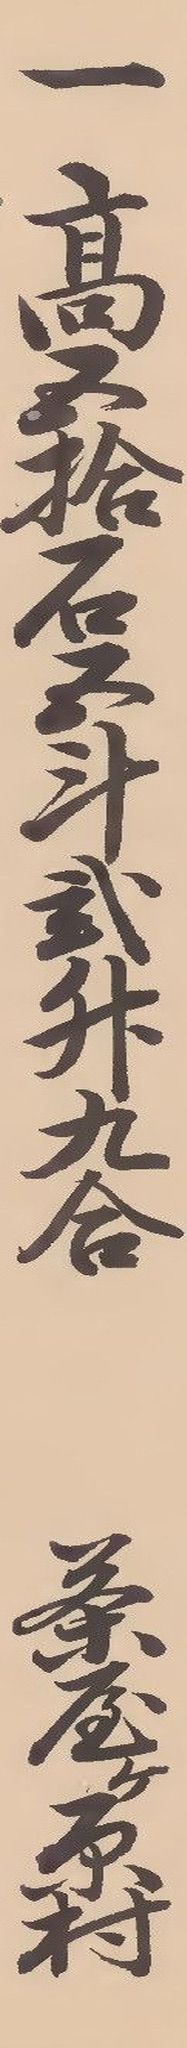一高五拾石五斗弐升九合茶屋ヶ原村
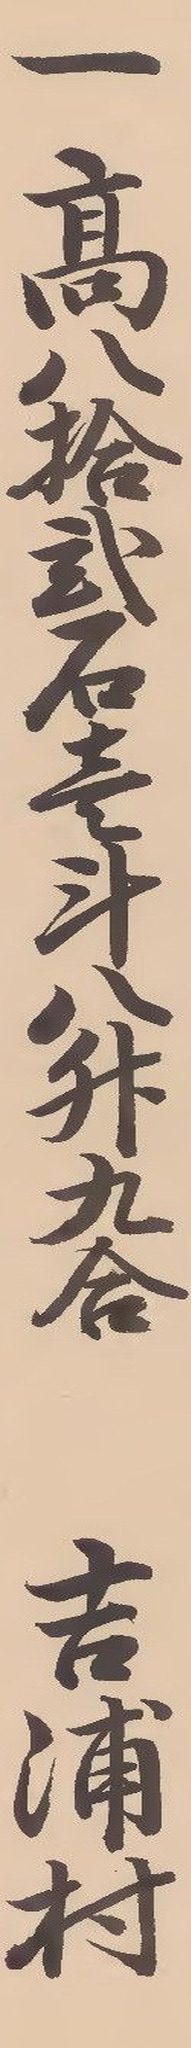一高八拾弐石壱斗八升九合吉浦村
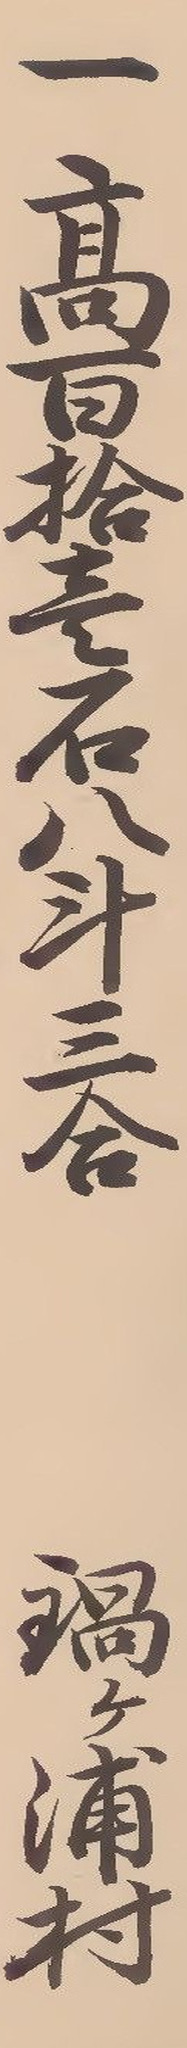一高百拾壱石八斗三合鍋ヶ浦村
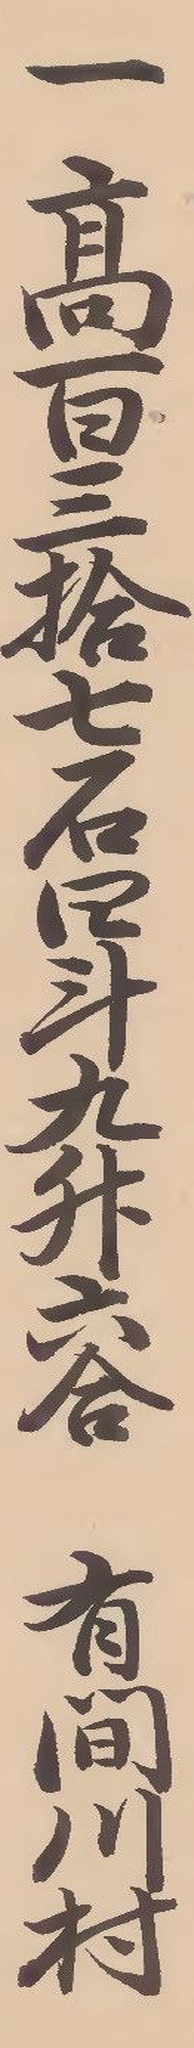一高百三拾七石四斗九升六合有間川村
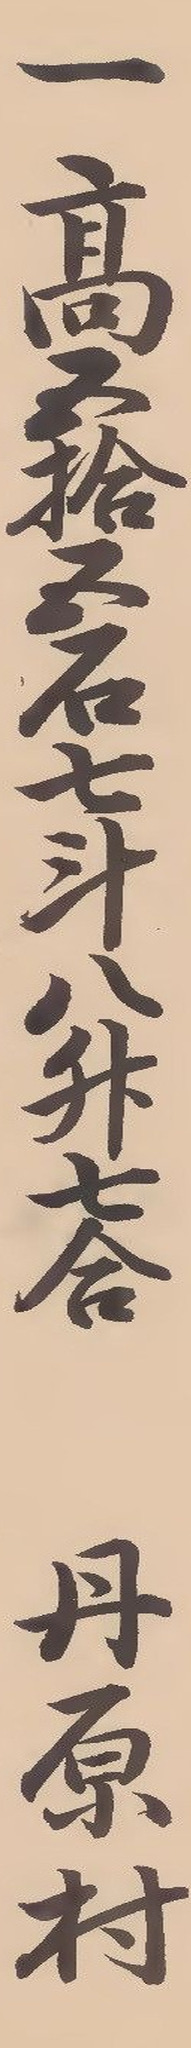一高五拾五石七斗八升七合丹原村
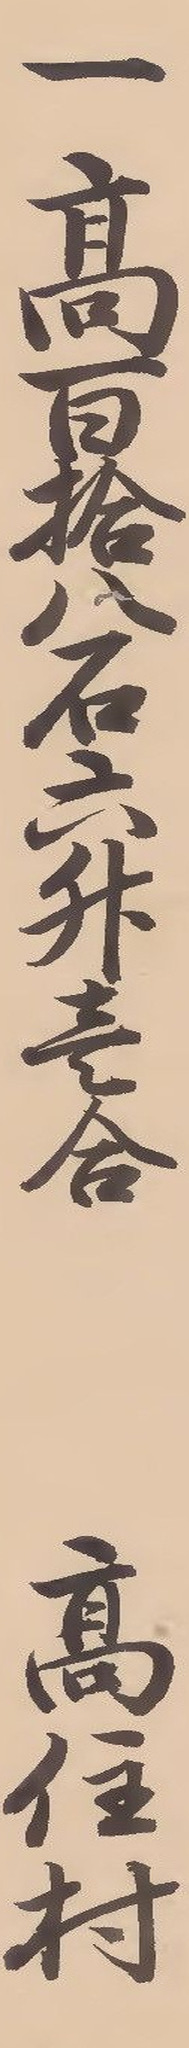一高百拾八石六升壱合高住村

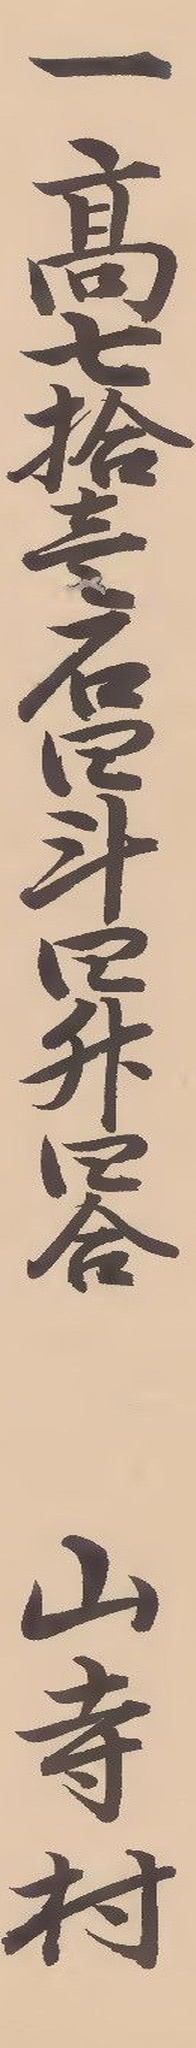一高七拾壱石四斗四升四合山寺村
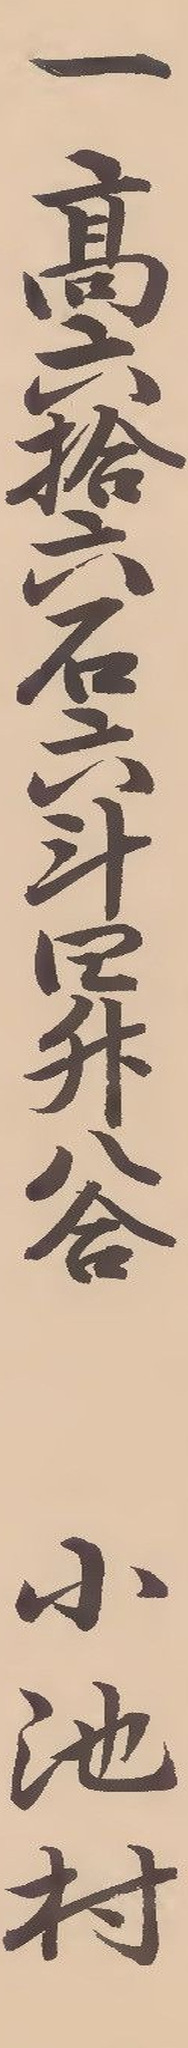一高六拾六石六斗四升八合小池村
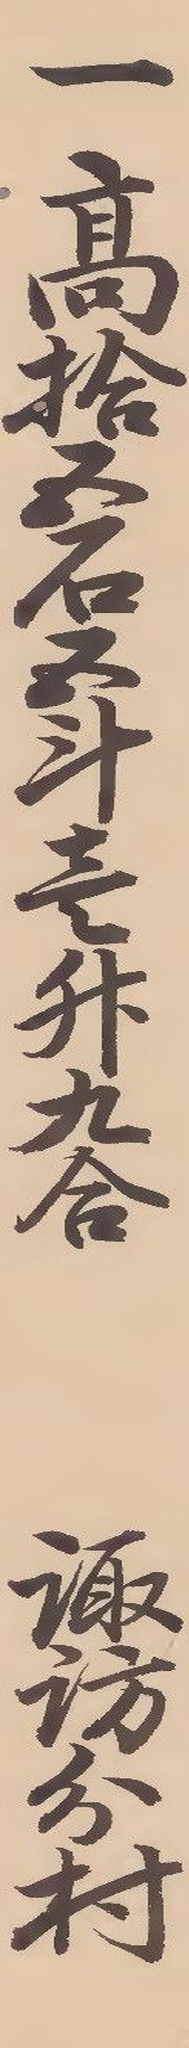一高拾五石五斗壱升九合諏訪分村
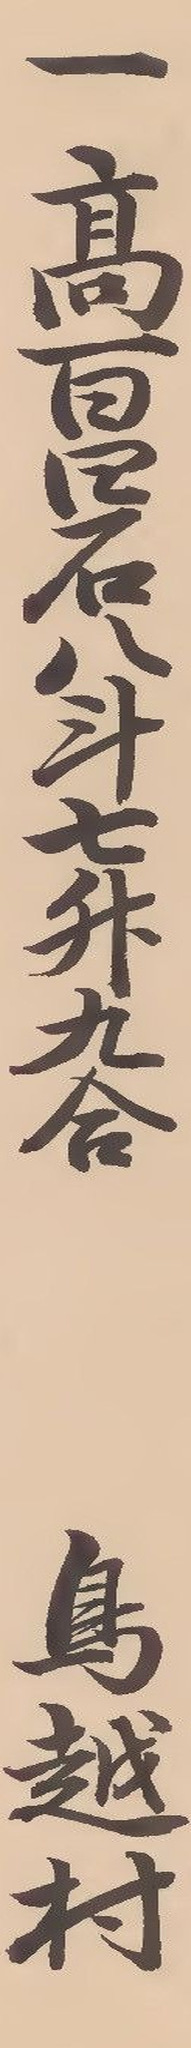一高百四石八斗七升九合鳥越村
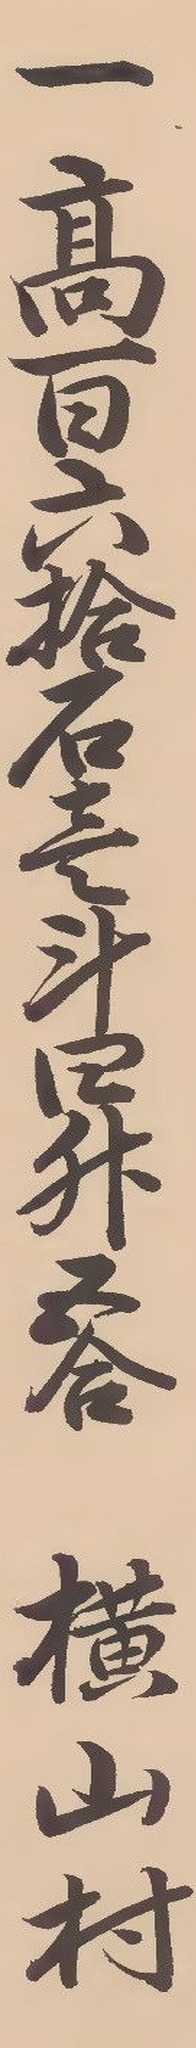一高百六拾石壱斗四升五合横山村
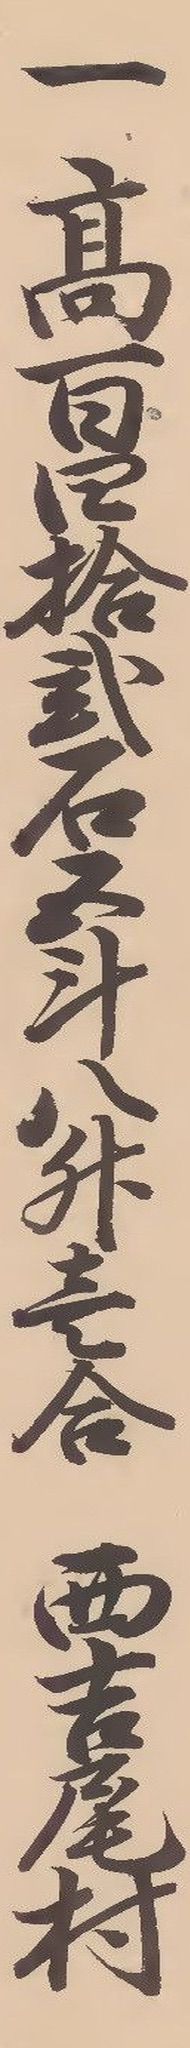一高百四拾弐石五斗八升壱合西吉尾村
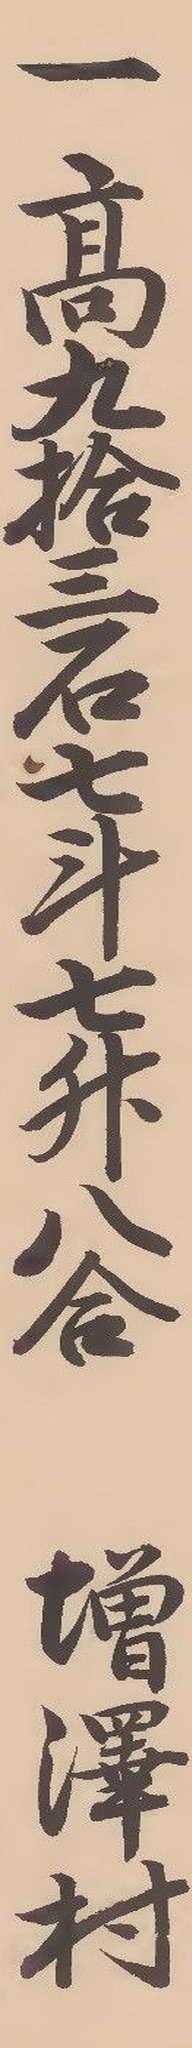一高九拾三石七斗七升八合増沢村
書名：越後国郷帳　上
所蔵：国立公文書館 National Archives of Japan
